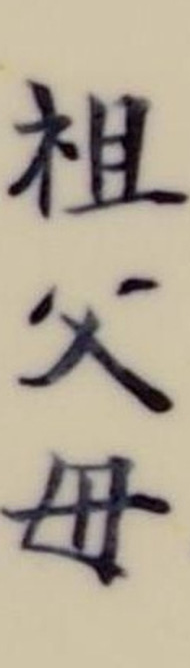祖父母
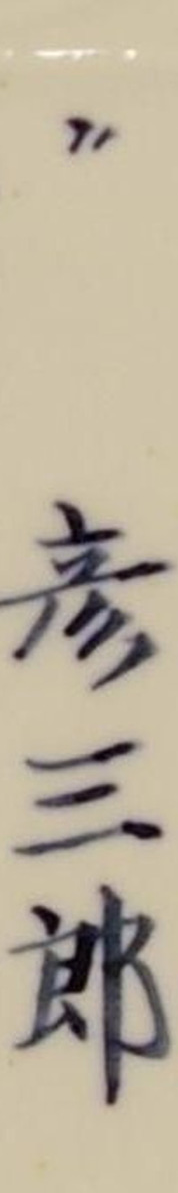彦三郎
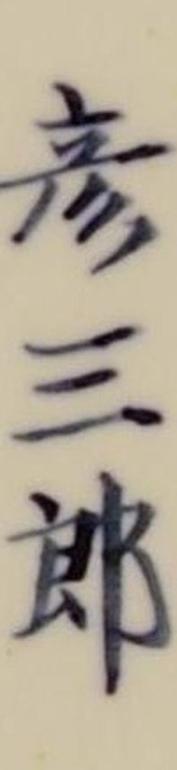彦三郎
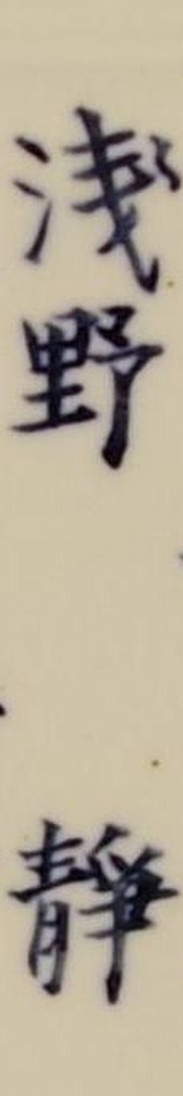浅野静
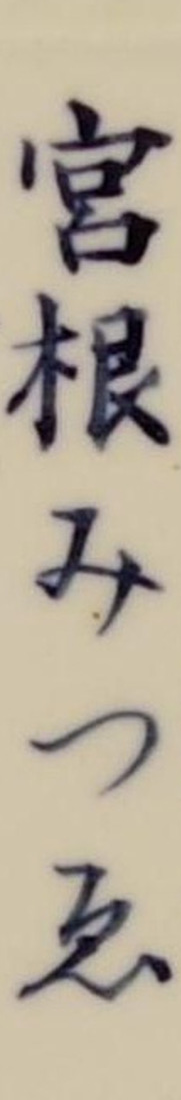宮根みつゑ
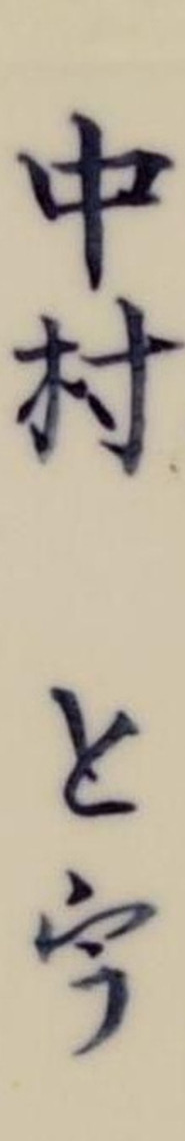中村とう
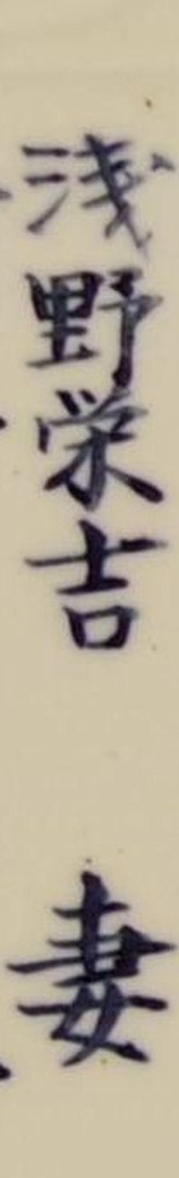浅野栄吉妻
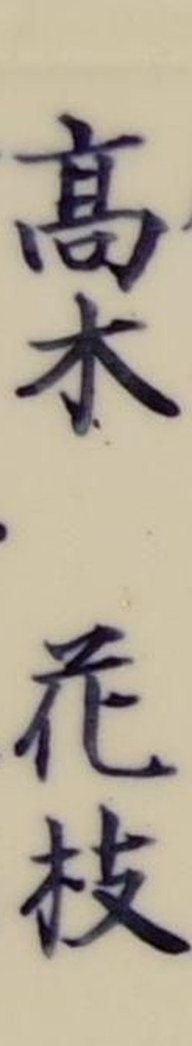高木花枝
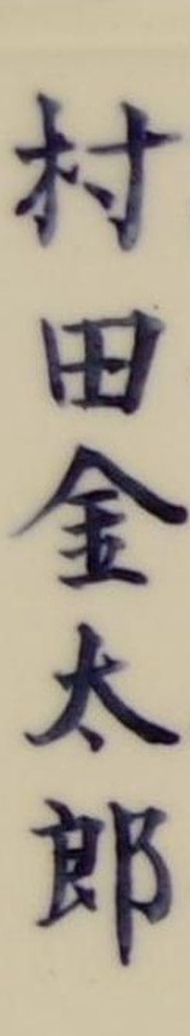村田金太郎
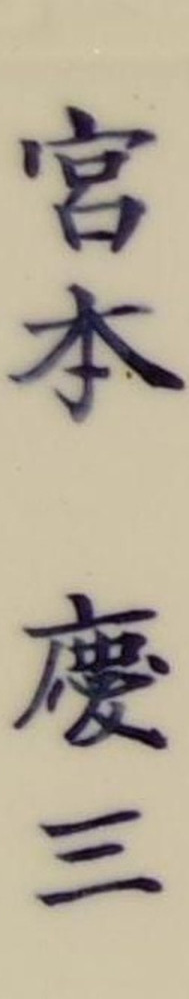宮本慶三
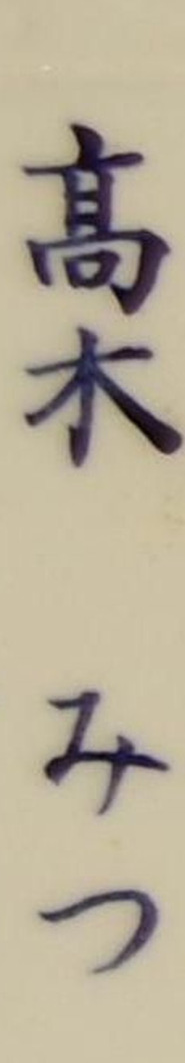高木みつ

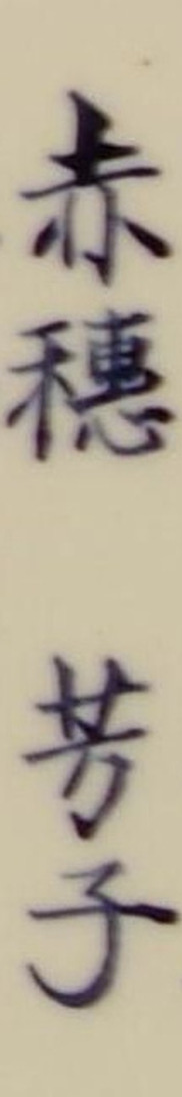赤穂芳子
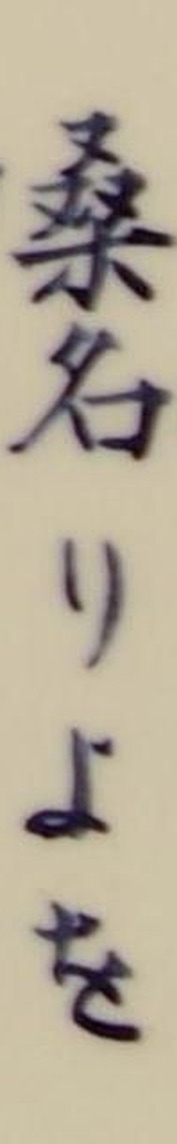桑名りよを
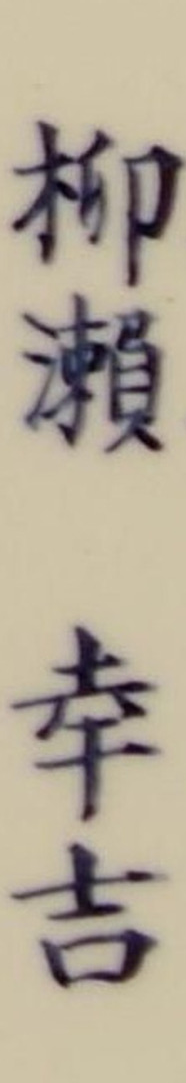柳瀬幸吉
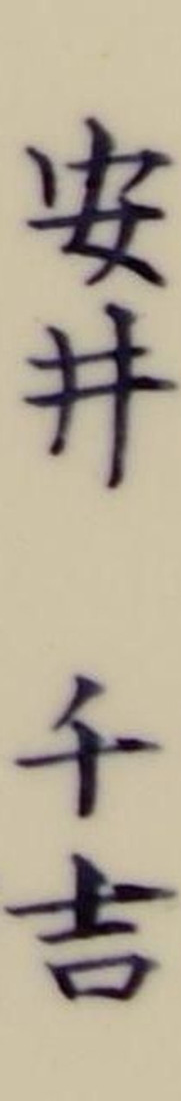安井千吉
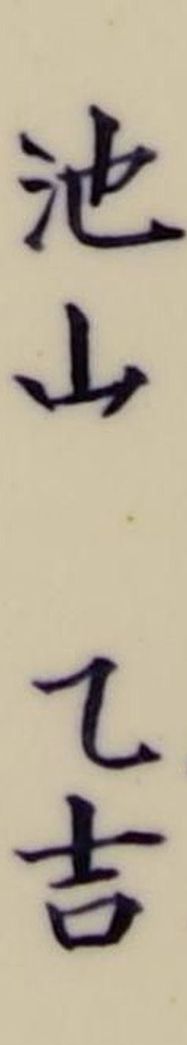池山乙吉
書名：E~L
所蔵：高野山金剛峯寺
